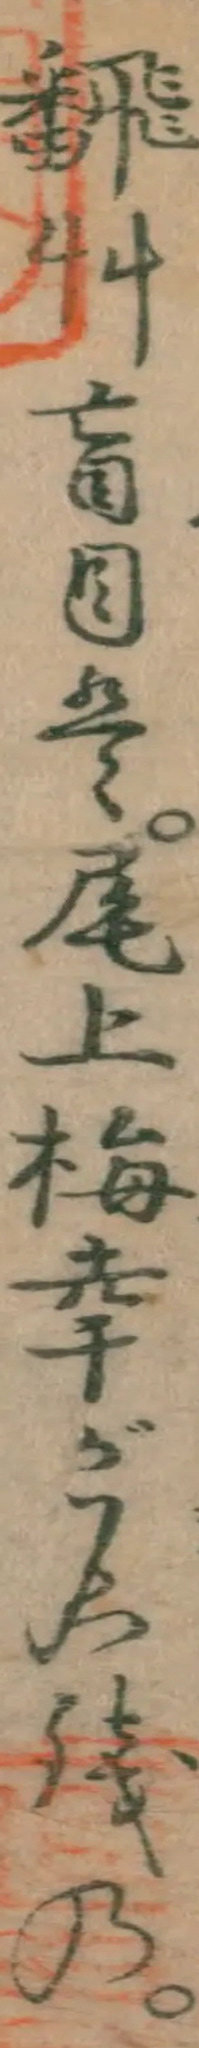翻草盲目は。尾上梅幸が名残の。
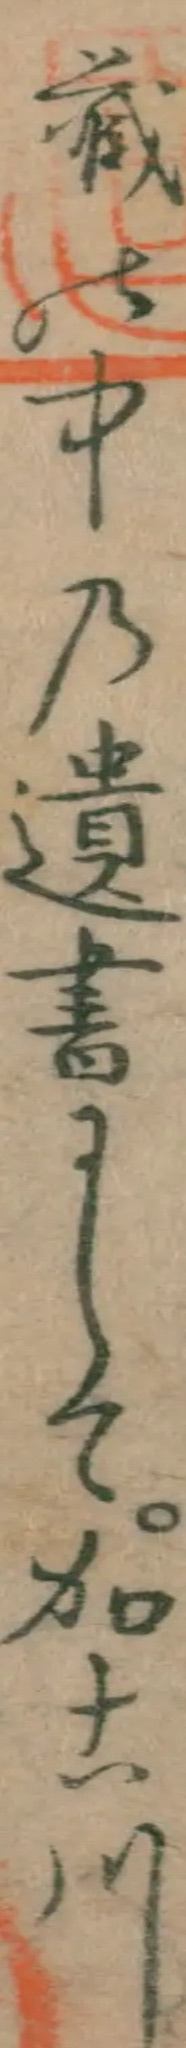蔵の中の遺書にして。加古川
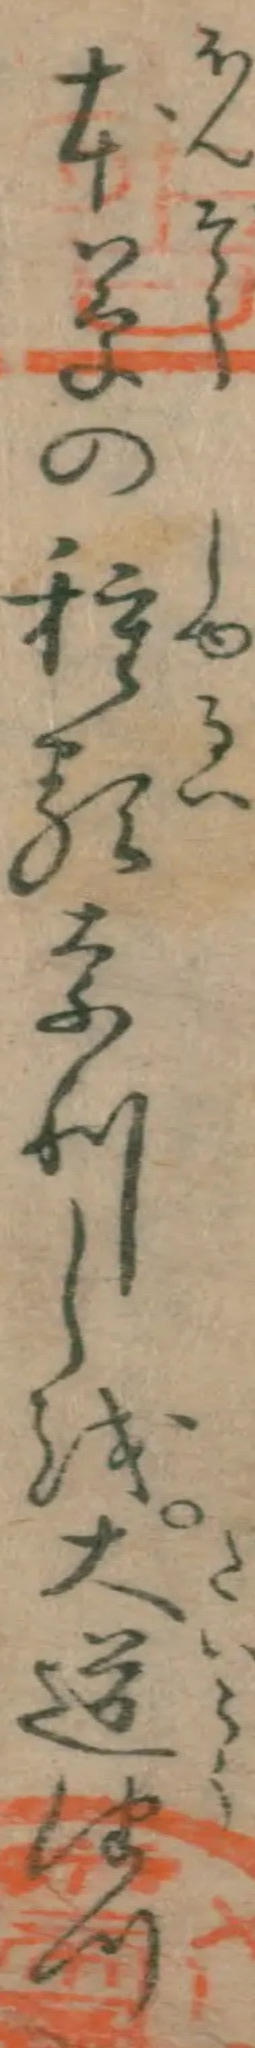本草の種類なりしを。大道津川
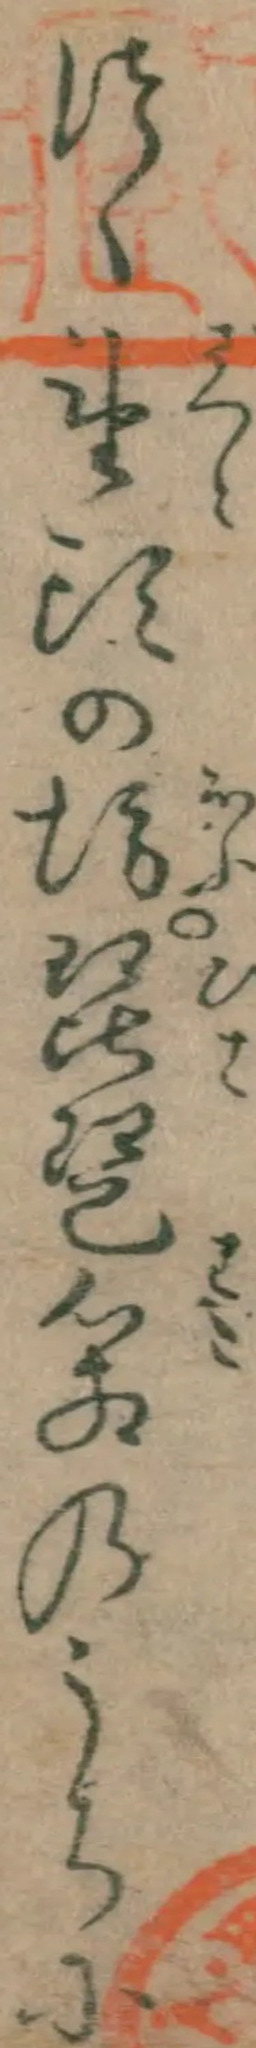つゝ坐頭の坊。琵琶箱のうちに
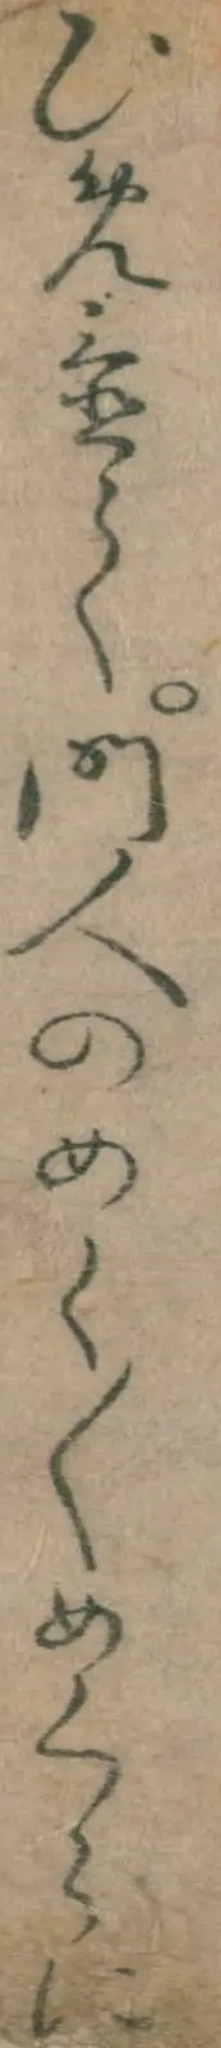しめ置て。門人のめく〳〵めくらに
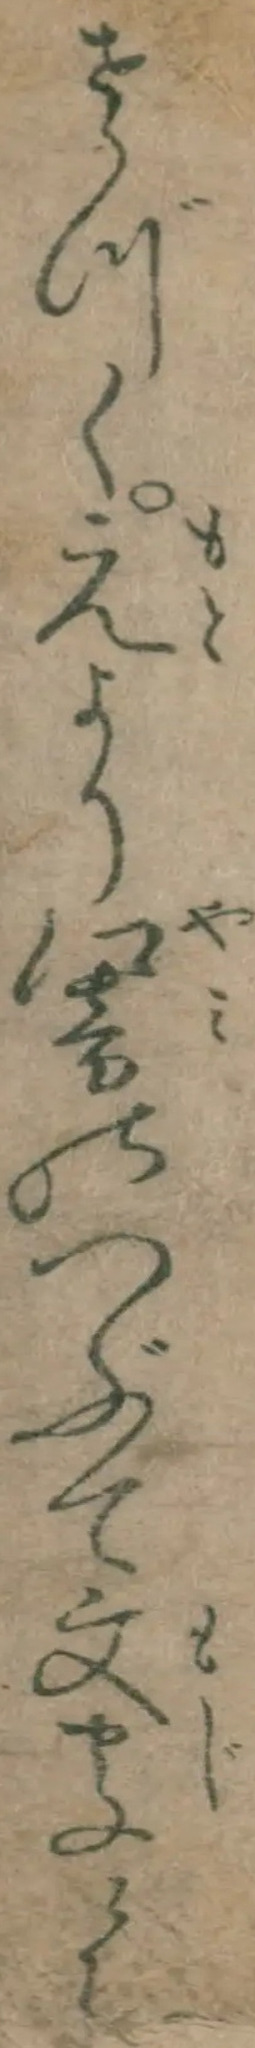せゝづく。元より闇のつぶて文字に

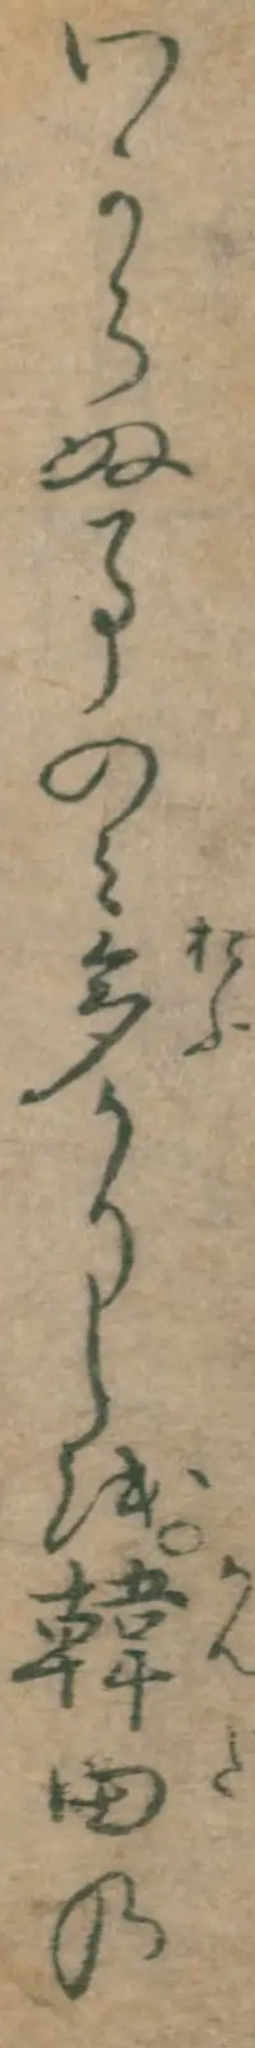わからぬ事のみ多かりしを。韓田の
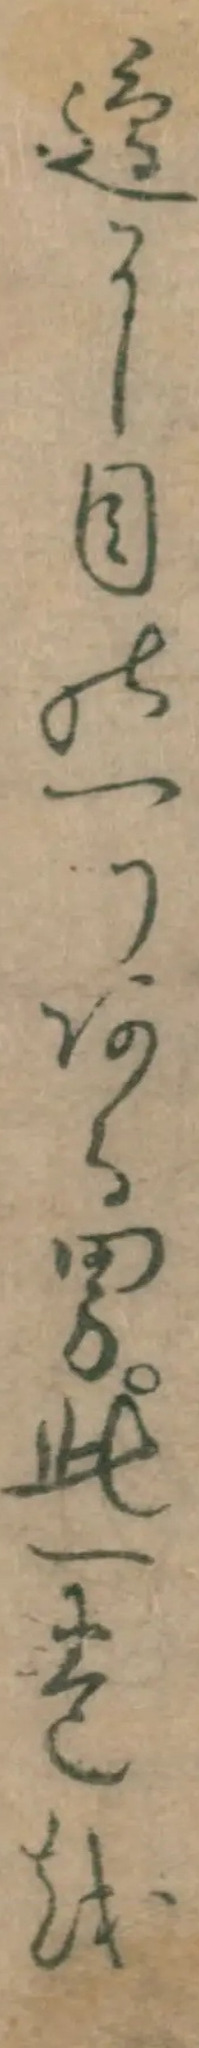辺に目の一つある男。此一巻を
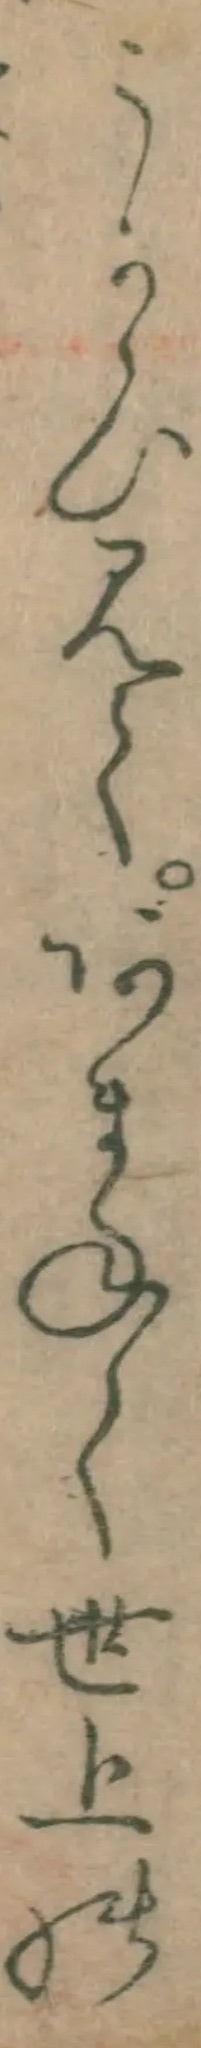うかゝひ見て。あまねく世上の
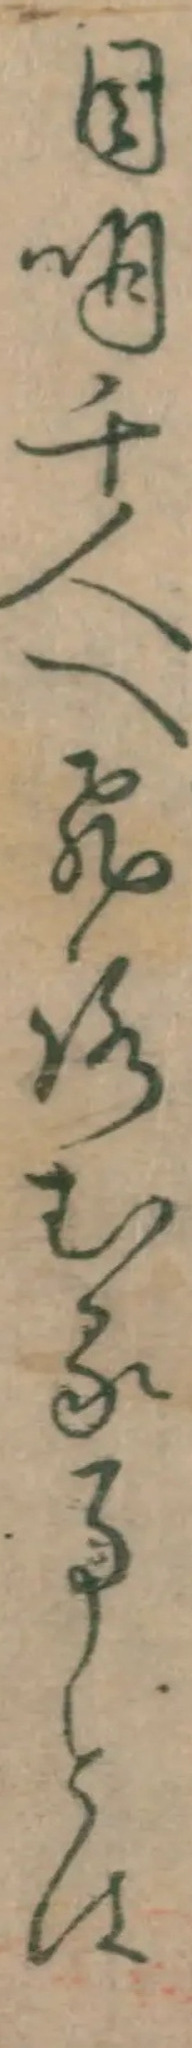目明千人へ。ひろむる事とは
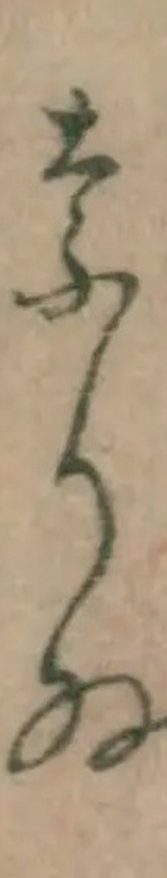なりぬ
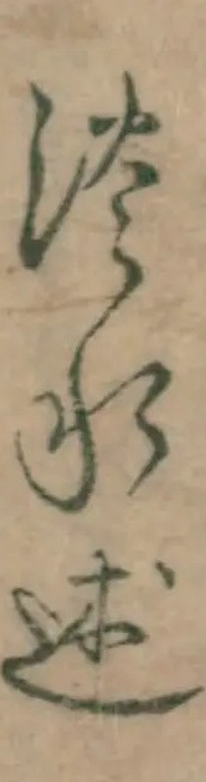淡水述
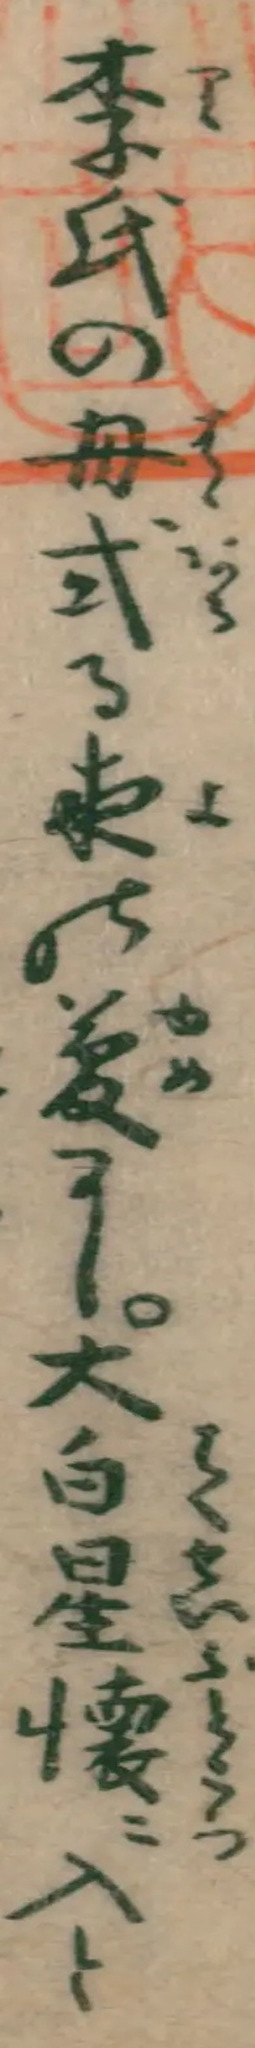李氏の母或る夜の夢に。大白星懐に入と
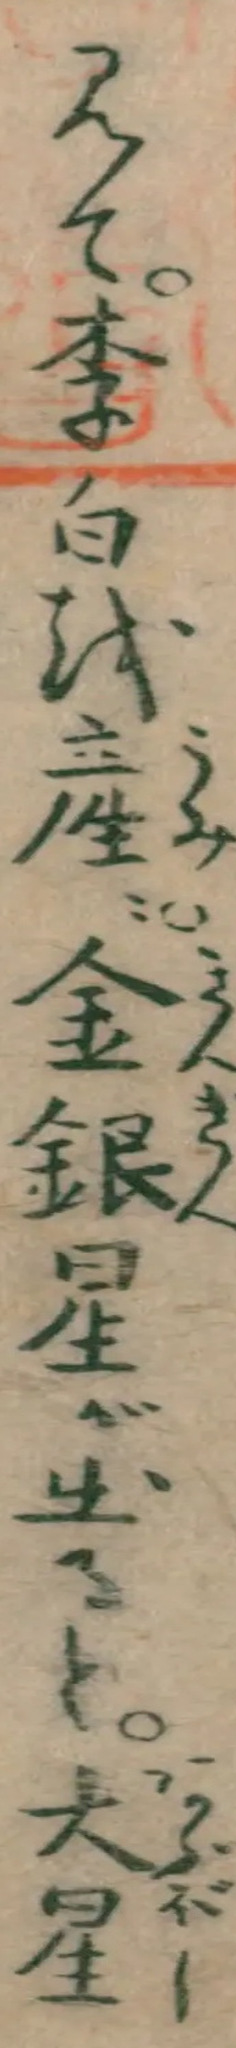見て。李白を産。金銀星が出ると。大星
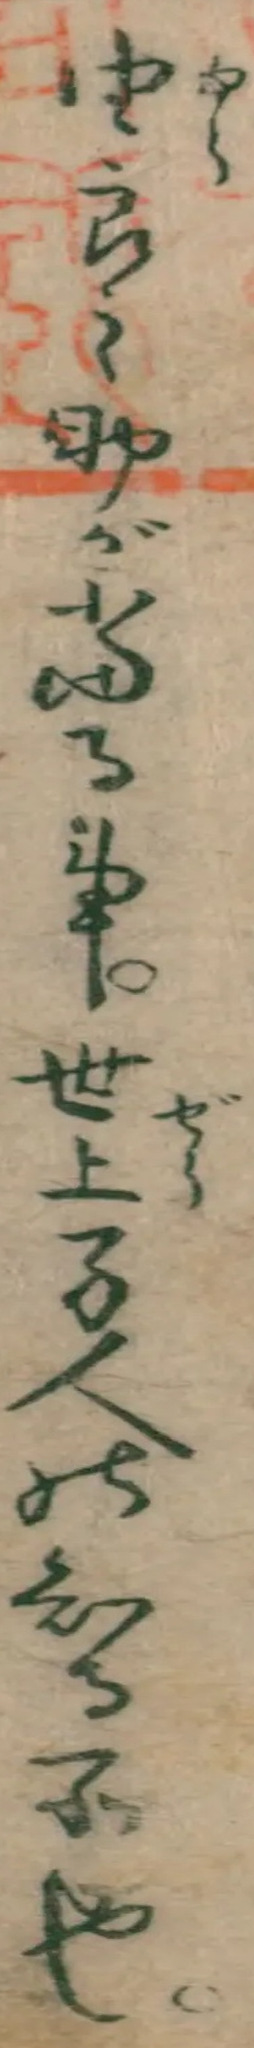由良之助が当ること。世上万人の知る所也。
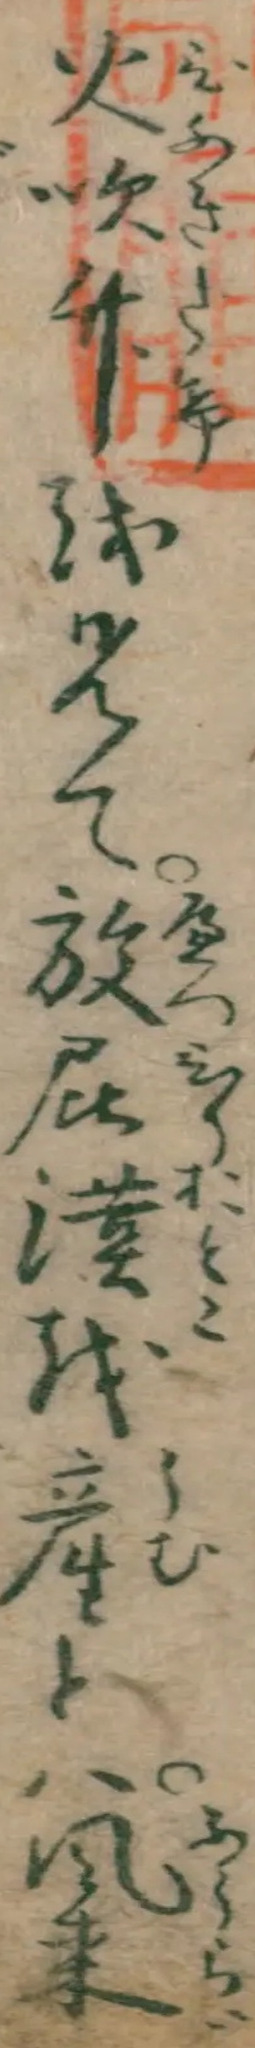火吹竹を見て。放屁漢を産とは。風来
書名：翻草盲目
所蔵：国立国会図書館 National Diet Library, JAPAN
